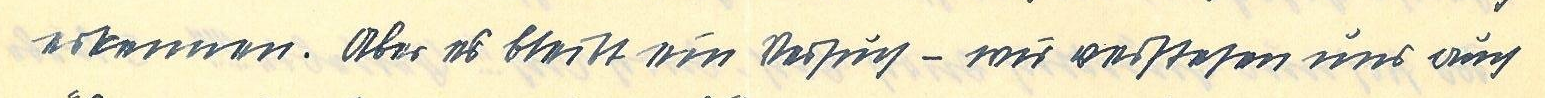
erkennen. Aber es bleibt ein Versuch – wir verstehen uns auch
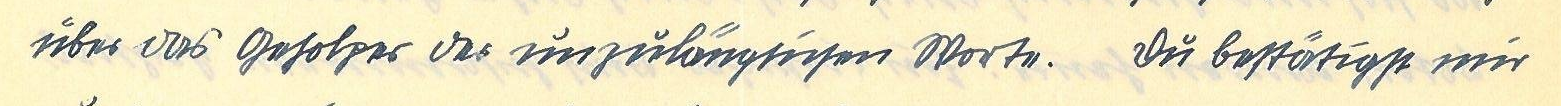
über das Geholper der unzulänglichen Worte. Du bestätigst mir
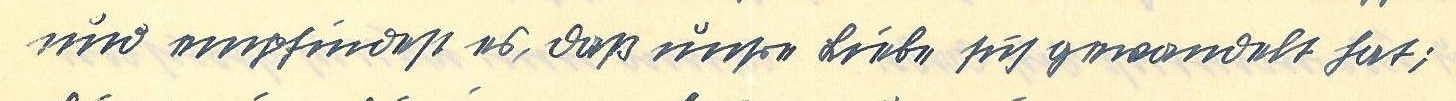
und empfindest es, daß unsere Liebe sich gewandelt hat;
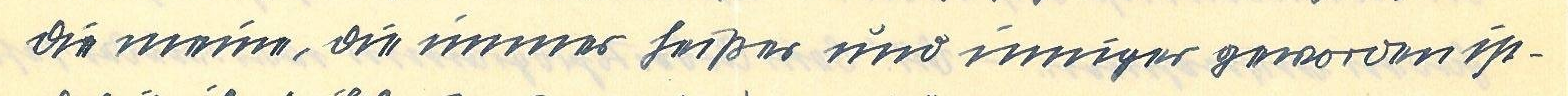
die meine, die immer heißer und inniger geworden ist –
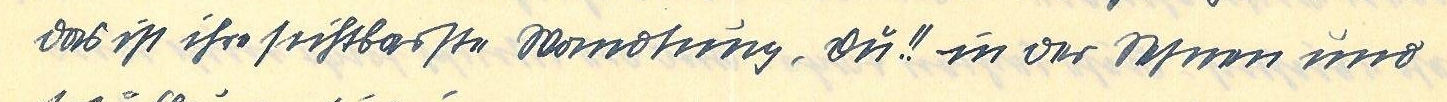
das ist ihre sichtbarste Wandlung, Du!! In der Sehnen und
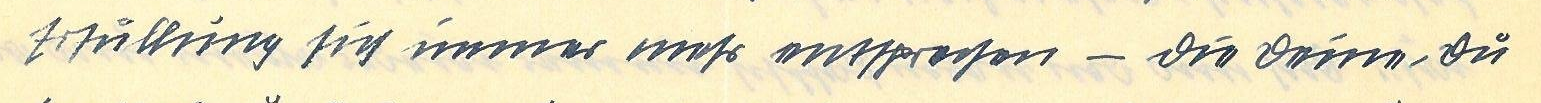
Erfüllung sich immer mehr entsprechen – die Deine, Du
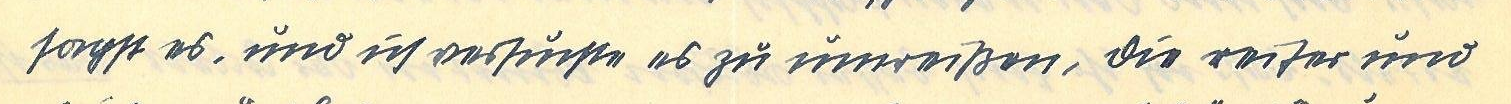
sagst es, und ich versuchte es zu umreißen, die reifer und
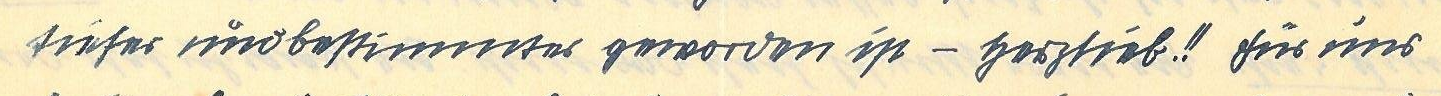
tiefer und bestimmter geworden ist – Herzlieb!! Für uns
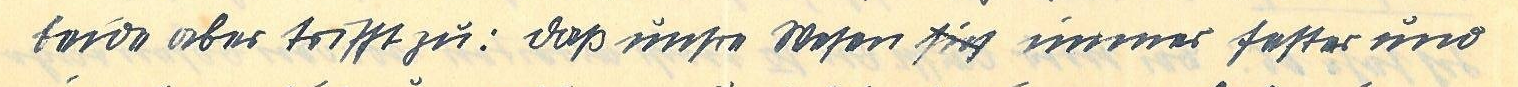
beide aber trifft zu: daß unsere Wesen sich immer fester und
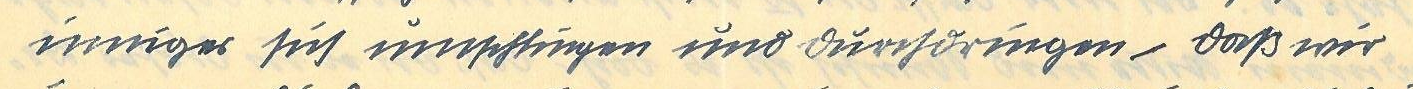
inniger sich umschlingen und durchdringen, daß wir
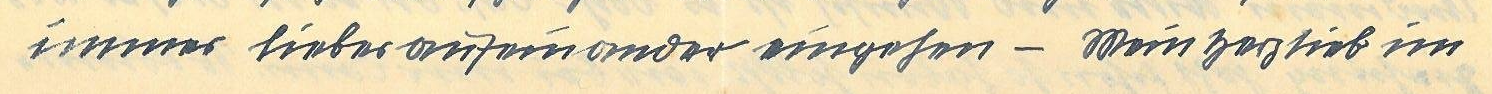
immer lieber aufeinander eingehen – Mein Herzlieb im
